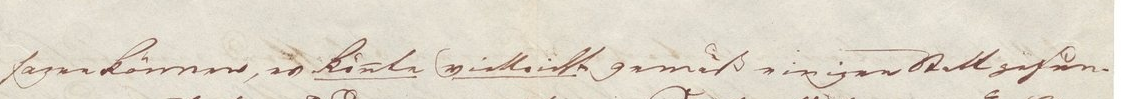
sagen können, es könntevielleicht gemäß einigen Statt gefun-
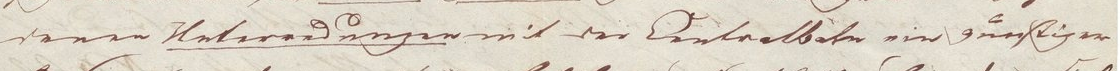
denen Unterredungen mit der Centralbahn ein günstiger
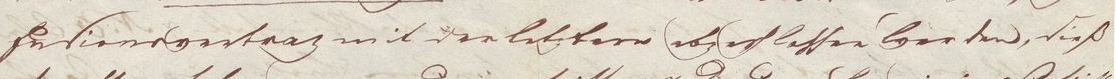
Fusionsvertrag mit der letztern abgeschlossen werden, dieß
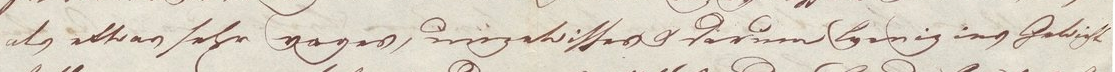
als etwas sehr vages, ungewisses & darum wenig ins Gewicht
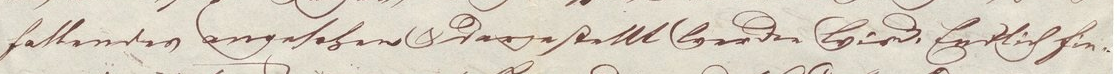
fallendes angesehen & dargestellt werden wird. Endlich fin-
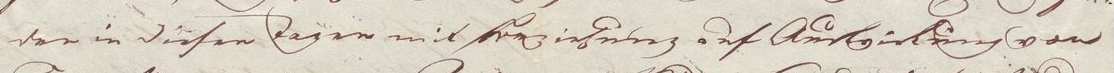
den in diesen Tagen mit Beziehung auf Auswirkung von
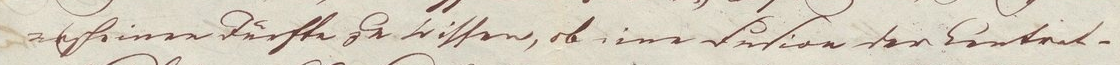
erscheinen dürfte zu wissen, ob eine Fusion der Central-
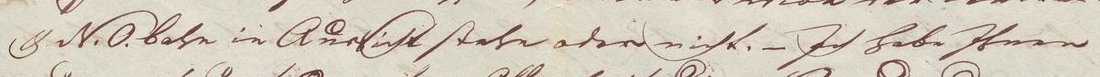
& N.O.bahn in Aussicht stehe oder nicht. – Ich habe Ihnen
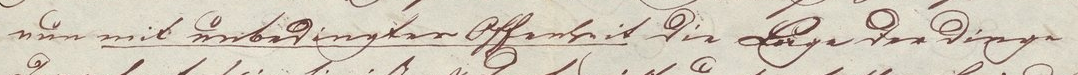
nun mit unbedingter Offenheit die Lage der Dinge
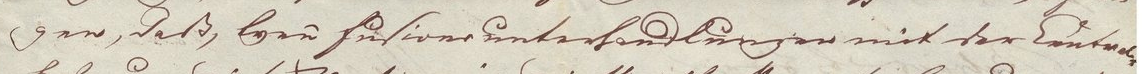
gen, daß, wenn Fusionsunterhandlungen mit der Central-
